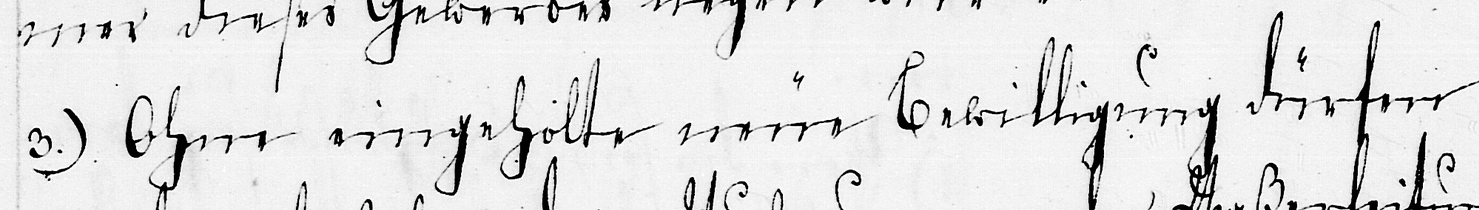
3.) Ohne eingeholte neue Bewilligung dürfen
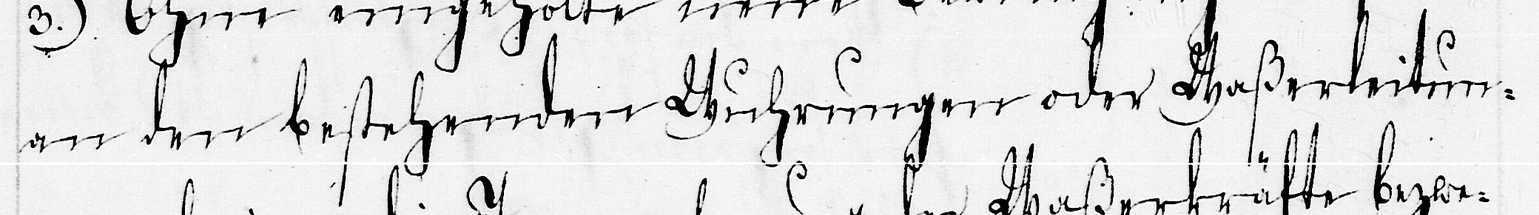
an den bestehenden Wuhrungen oder Waßerleitun¬
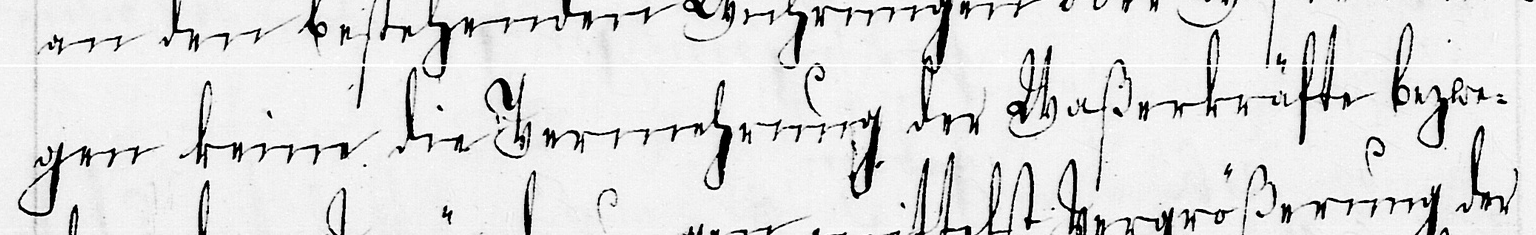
gen keine die Vermehrung der Waßerkräfte bezwe¬
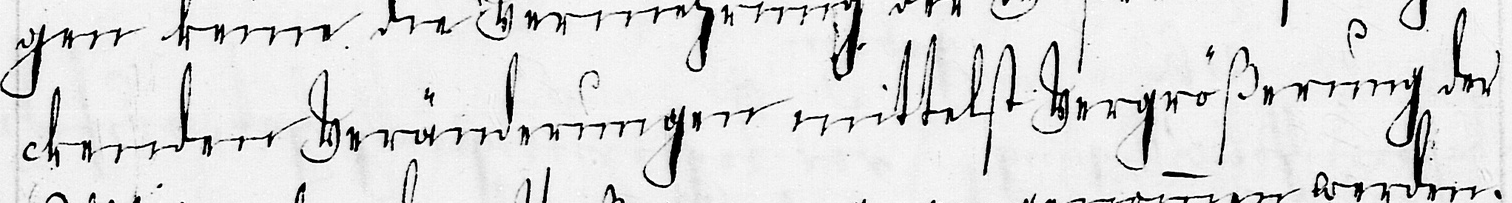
ckenden Veränderungen mittelst Vergrößerung der
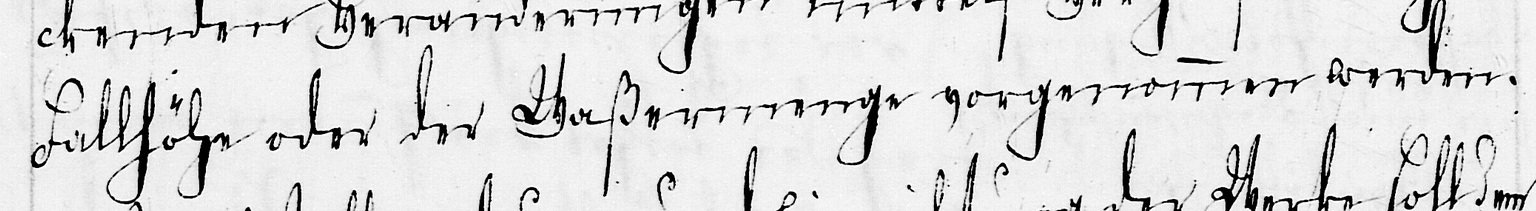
Fallhöhe oder der Waßermenge vorgenommen werden.
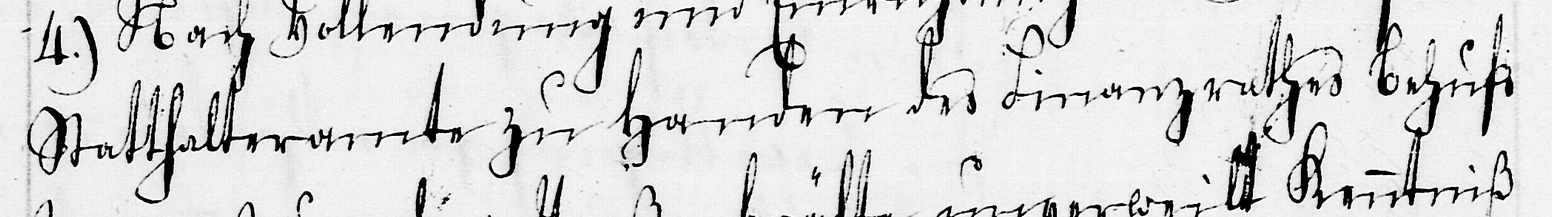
Statthalteramte zu Handen des Finanzrathes Behufs
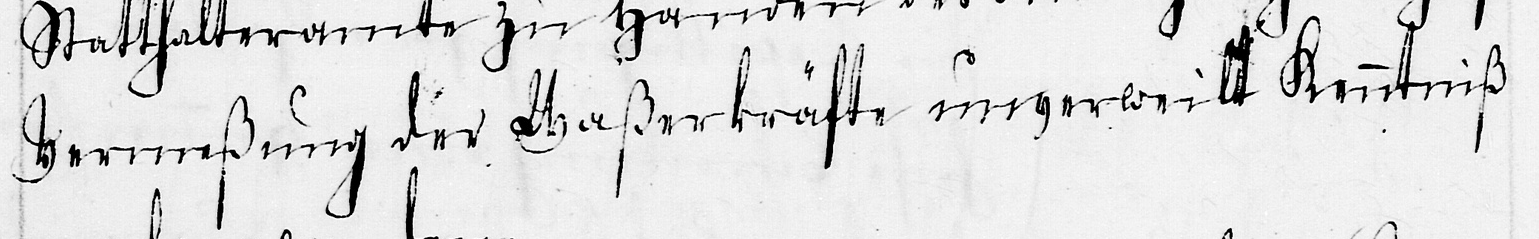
Vermeßung der Waßerkräfte unverweilt Kenntniß
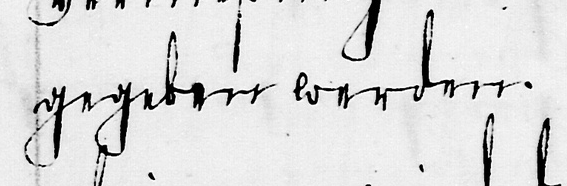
gegeben werden.
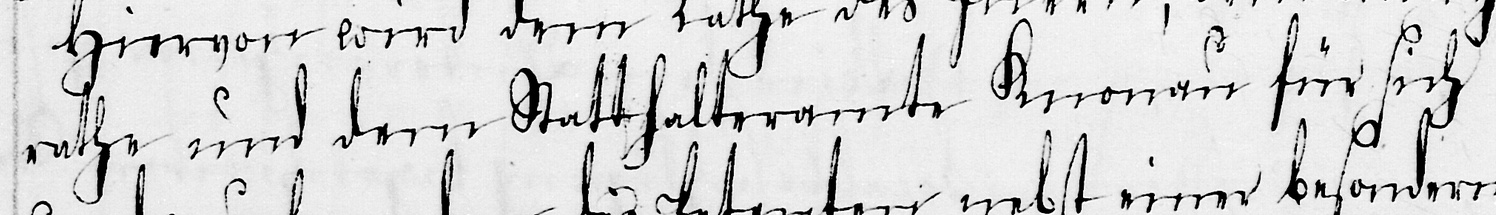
rathe und dem Statthalteramte Knonau für sich
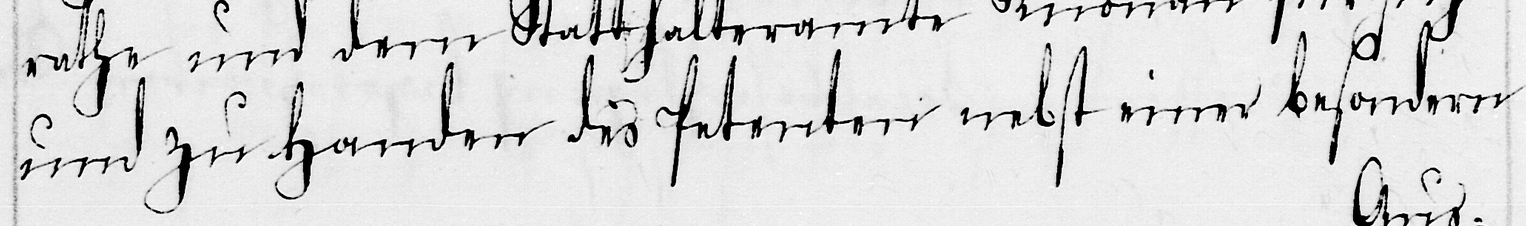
und zu Handen des Petenten nebst einer besondern
